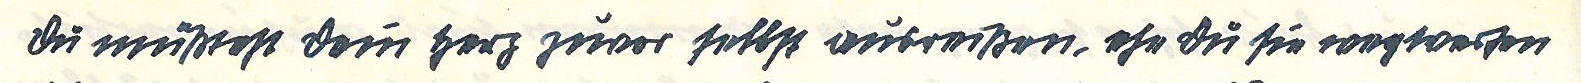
Du müßtest Dein Herz zuvor selbst ausreißen, ehe Du sie wegwerfen
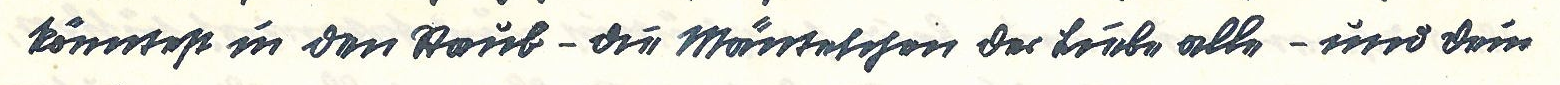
könntest in den Staub – die Mäntelchen der Liebe alle – und Dein
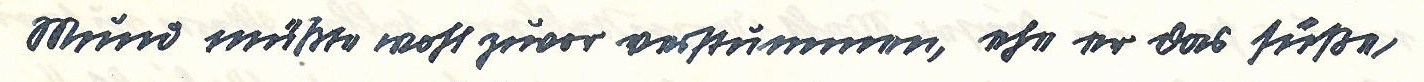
Mund müßte wohl zuvor verstummen, ehe er das süße,
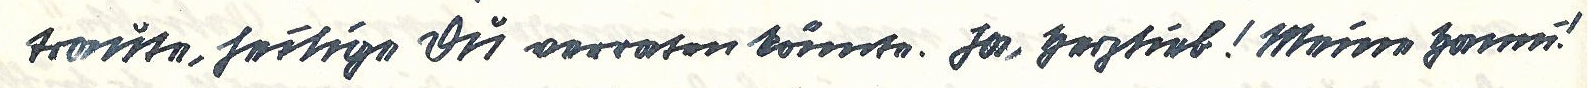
traute, heilige Du verraten könnte. Ja, Herzlieb! Meine!
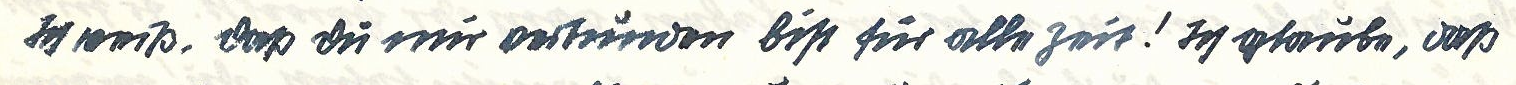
Ich weiß, daß Du mir verbunden bist für alle Zeit! Ich glaube, daß
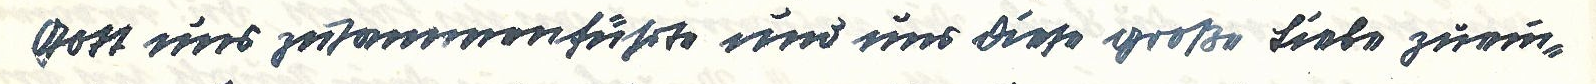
Gott uns zusammen führte und uns diese große Liebe zuein¬
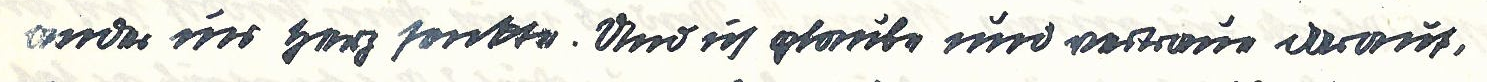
ander ins Herz senkte. Und ich glaube und vertraue darauf,
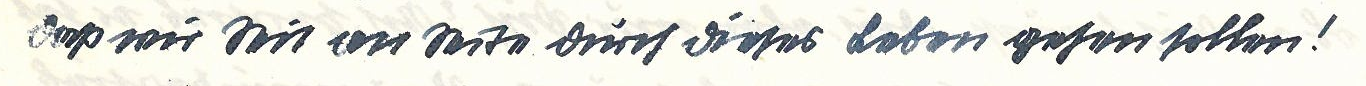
daß wir Seit an Seite durch dieses Leben gehen sollen!
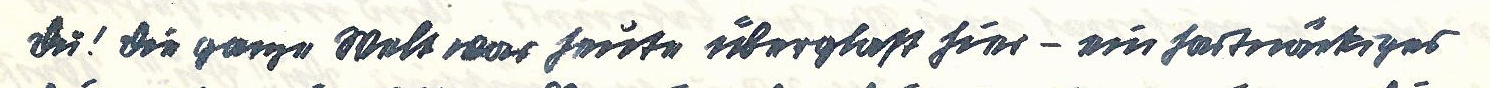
Du! Die ganze Welt war heute überglast hier – ein hartnäckiges
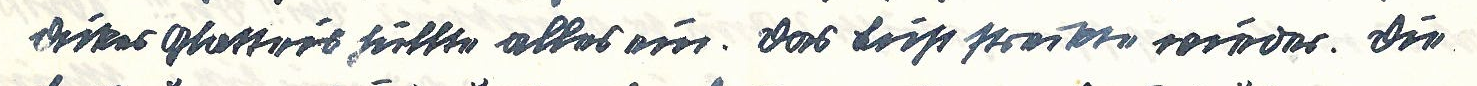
dickes Glatteis hüllte alles ein. Das Licht streikte wieder. Die
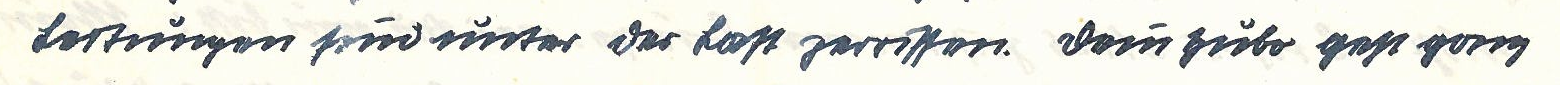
Leitungen sind unter der Last zerrissen. Dein Hubo geht ganz
